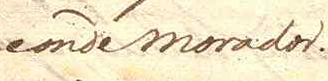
e onde morador.
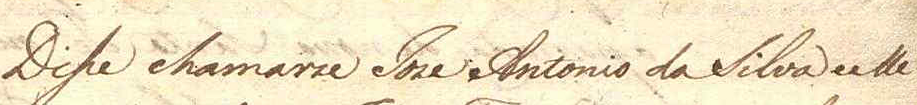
Disse chamarse Ioze Antonio da Silva e Me
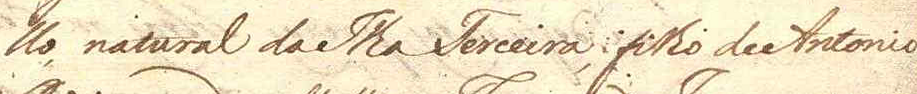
llo, natural da Ilha Terceira; filho de Antonio
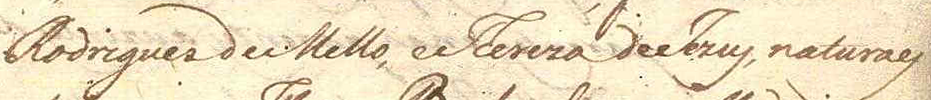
Rodrigues de Mello, e Thereza de Iezus, naturaes
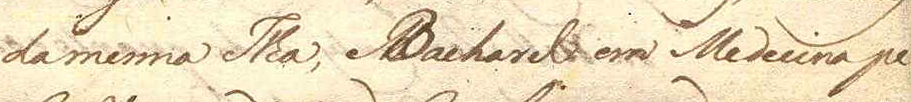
da mesma Ilha, Bacharel em Medecina pe
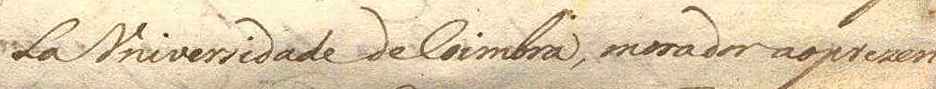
La Vniversidade de Coimbra, morador ao prezen
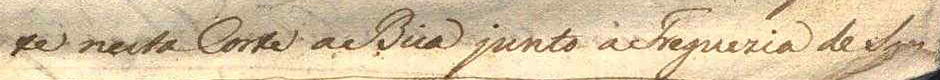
te nesta Corte a Bica junto a Freguezia de San
